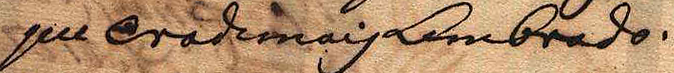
que era de mais Lembrado.
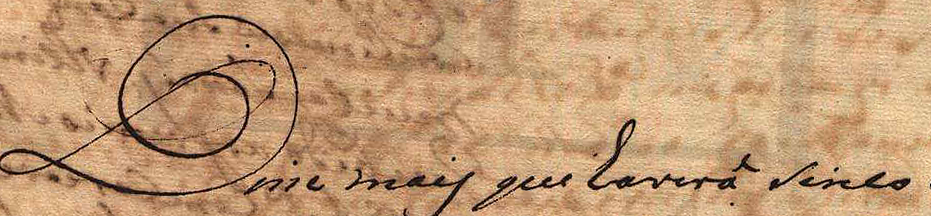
Disse mais que haverâ sinco
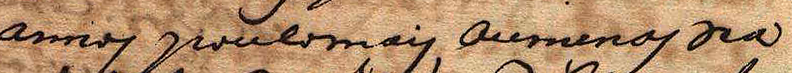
annos pouco mais, ou menos na
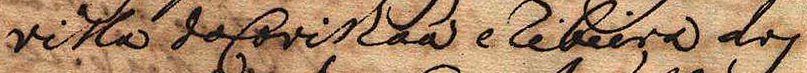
villa da Covilhaã e Ribeira dos
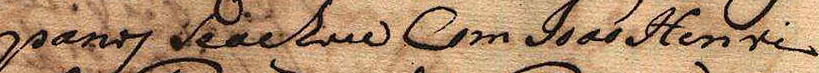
panos se achou Com Ioaõ Henri
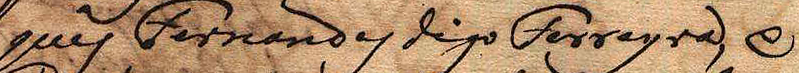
ques Fernandes digo Ferreyra, e
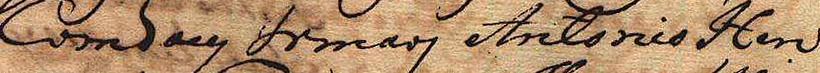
Com dous Irmaos Antonio Hen
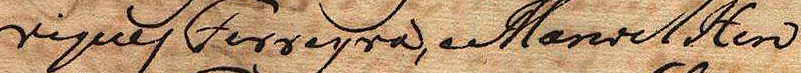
riques Ferreyra, e Manoel Hen
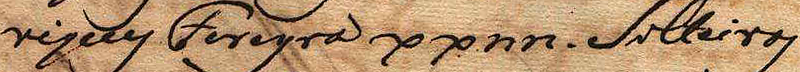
riques Fereyra xxnn. Solteiros
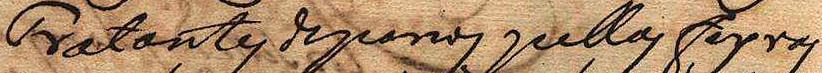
Tratantes de panos pellas feyras
